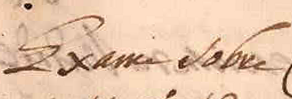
Exame sobre
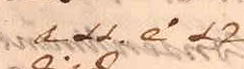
a 11. e 12
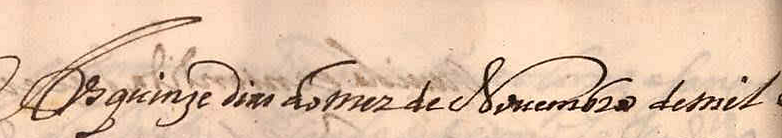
Aos quinze dias do mez de Nouembro de mil e
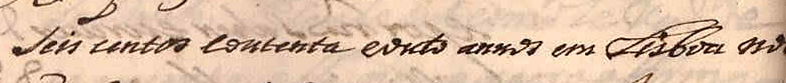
seiscentos e outenta e outo annos em Lisboa nos
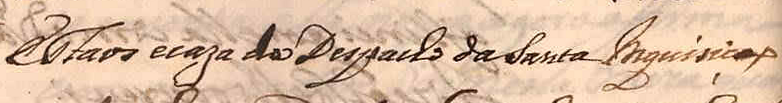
Estaos e caza do Despacho da Santa Inquisiçaõ
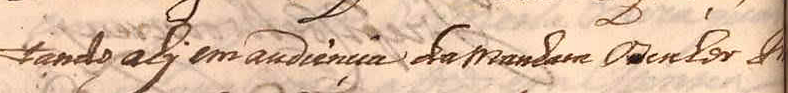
tando ahy em audiencia da manham O senhor In
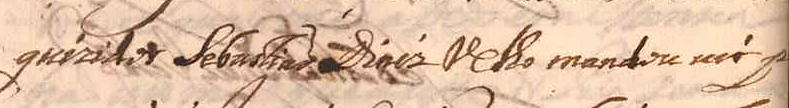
quizidor Sebastiaõ Diniz Velho mandou uir p
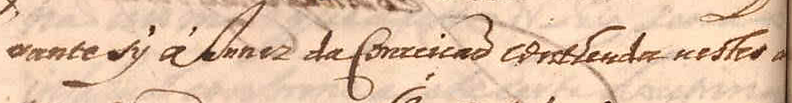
rante sy a Innez da Conceiçaõ contheuda nestes a
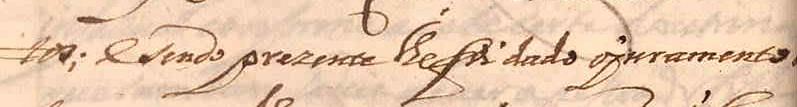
tos; E sendo prezente lhe foi dado o juramento
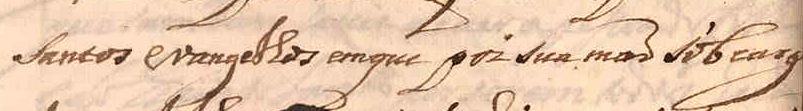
Santos evangelhos em que poz sua maõ sob carg
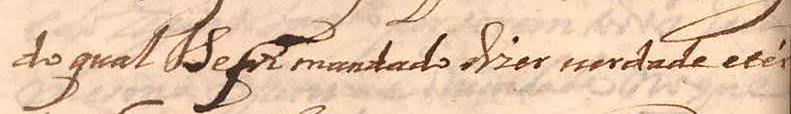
do qual lhe foi mandado dizer uerdade e ter
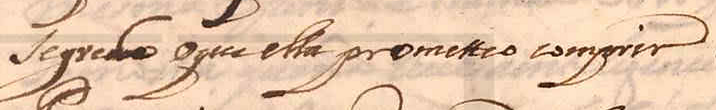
Segredo o que ella prometteo comprir
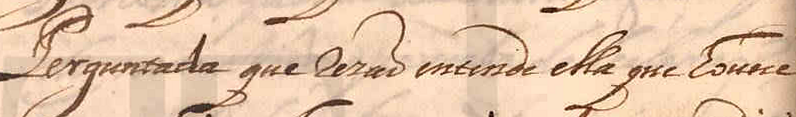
Perguntada que Rezaõ entende ella que houue
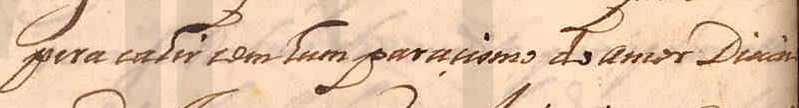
pera cahir com hum paracismo do amor Diuino
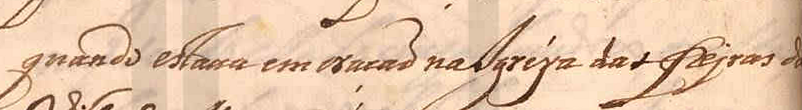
quando estaua em oraçaõ na Igreya das frejras da
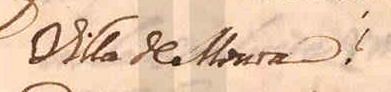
Villa de Moura?
